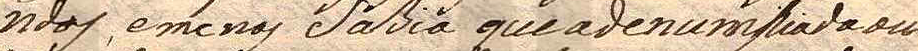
ndos, e menos sabia que a denumsiada ou
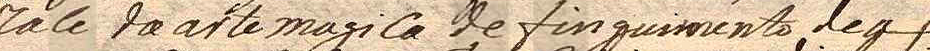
zace da arte magica de fingimento de a
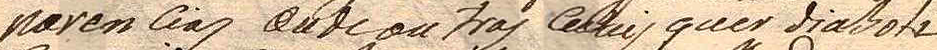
parencias ou de outras ceitas quer diaboli
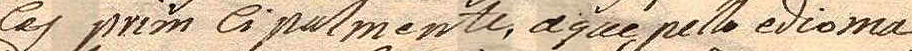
cas primcipalmente, a que pello edioma
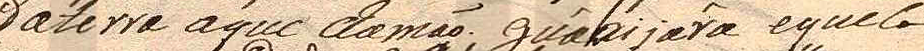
da terra a que chamão guábijará e que Co
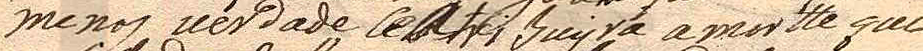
menos uerdade se atribuyra a mortte que
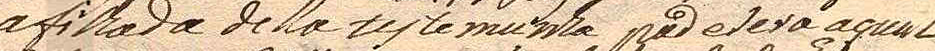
afilhada della testemunha pode sera a qual
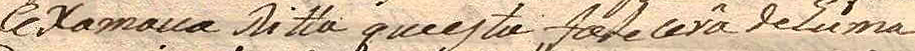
ce xamaua Ritta que esta faLecerá de huma
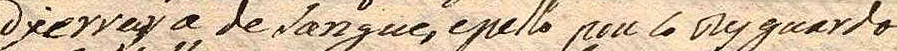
dyerreya de Sangue, e pello pouco Resguardo
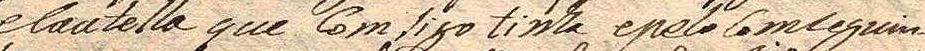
e Cautella que Comsigo tinha e pelo comceguin
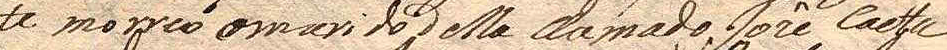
te morreo o marido della chamado Jozé Caetta
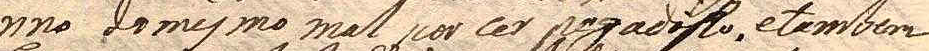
nno do mesmo mal por cer pegadosso, e tambem
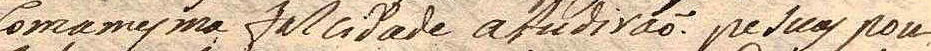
com a mesma falcidade aLudiraõ pesuas pou
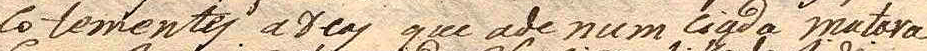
co tementes a Deos que a denumciada matara
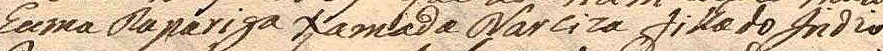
huma Rapariga xamada Narciza filha do Jndio
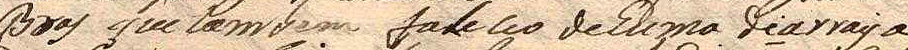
Bras que tambem faleceo de huma diarraya
